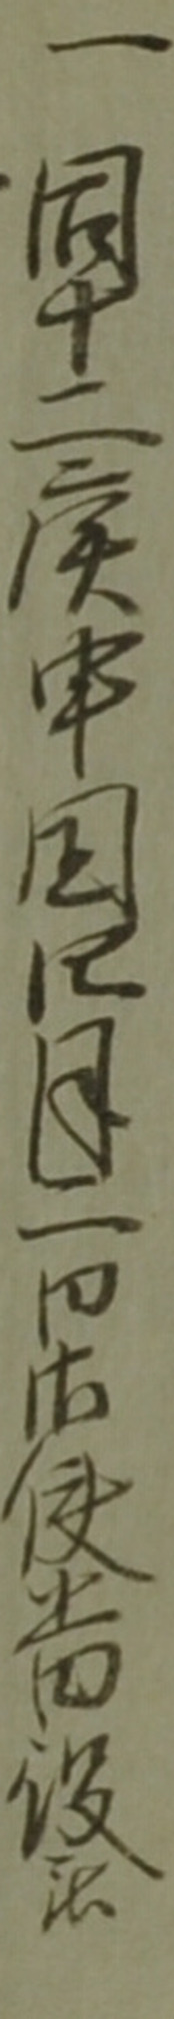一同十二庚申閏四月二日御使番役被
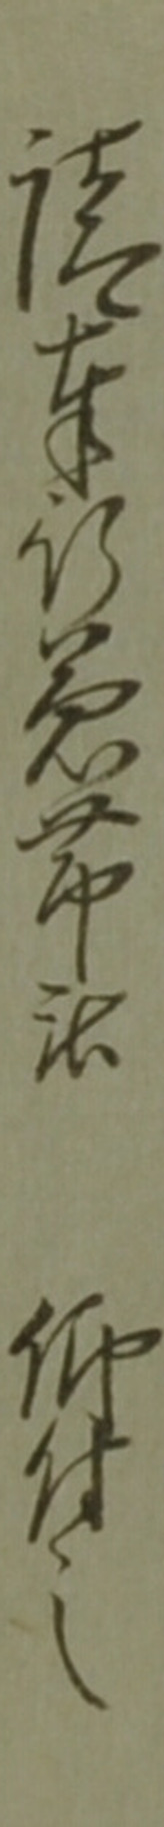請奉行兼帯被仰付之
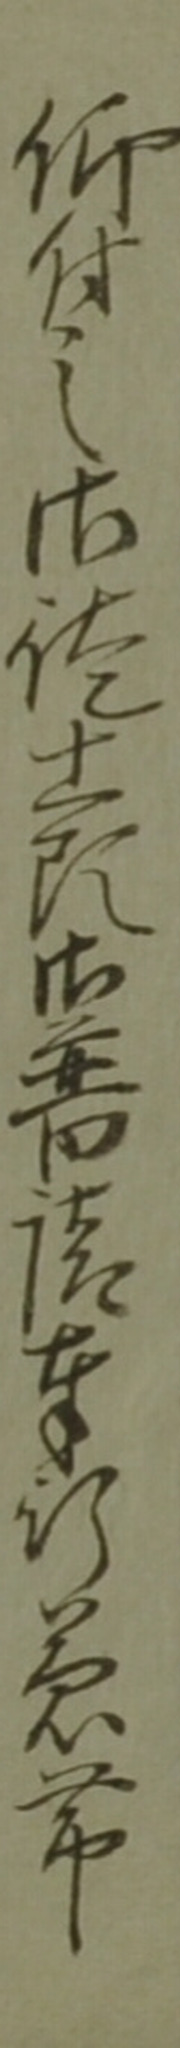仰付之御徒士頭御普請奉行兼帯
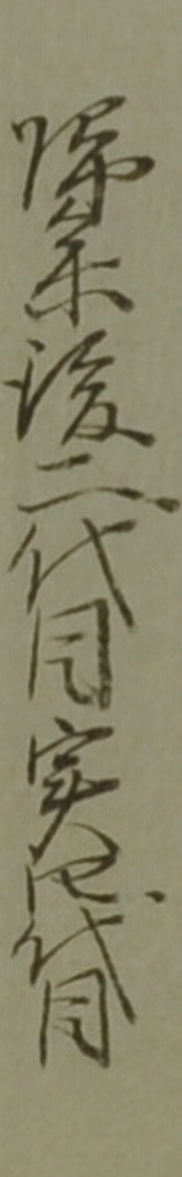帰参後二代目実四代目
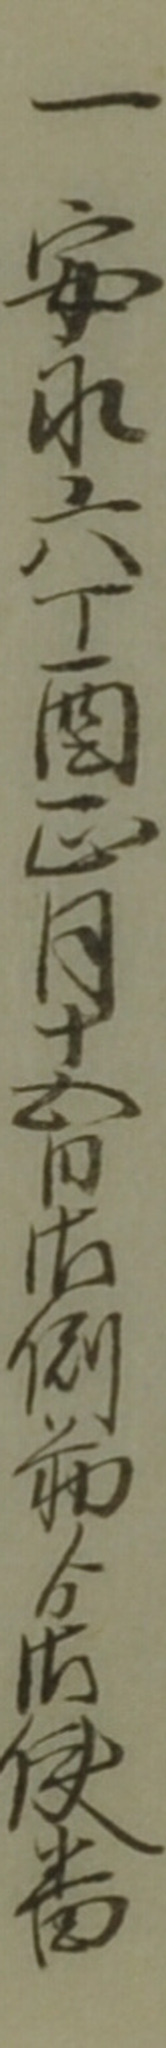一安永六丁酉正月十五日御側勤ゟ御使番
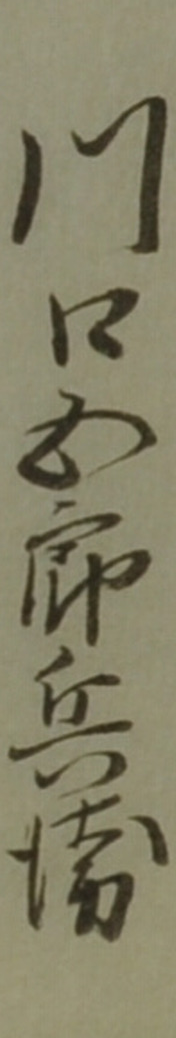川口五郎兵衛
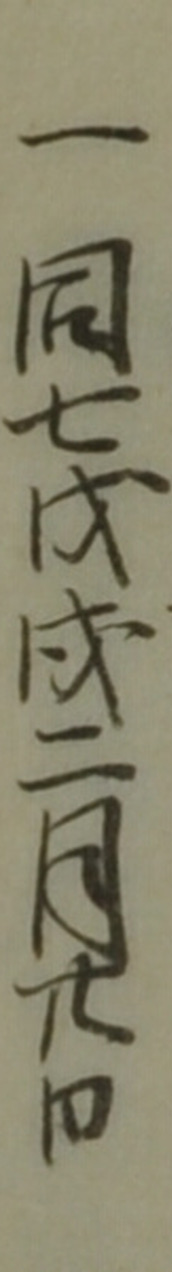一同七戊戌二月廿日
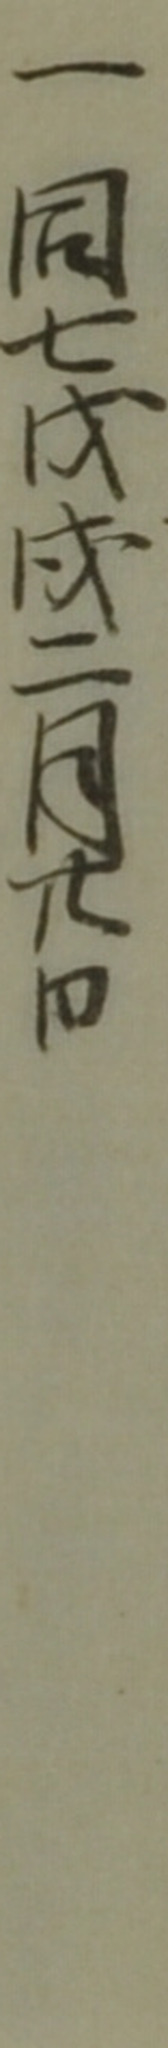一同七戊戌二月廿日
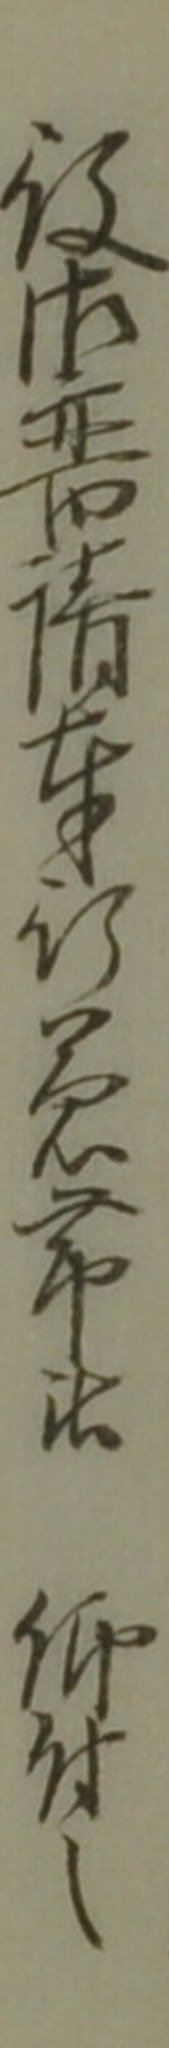役御普請無聊兼帯被仰付之
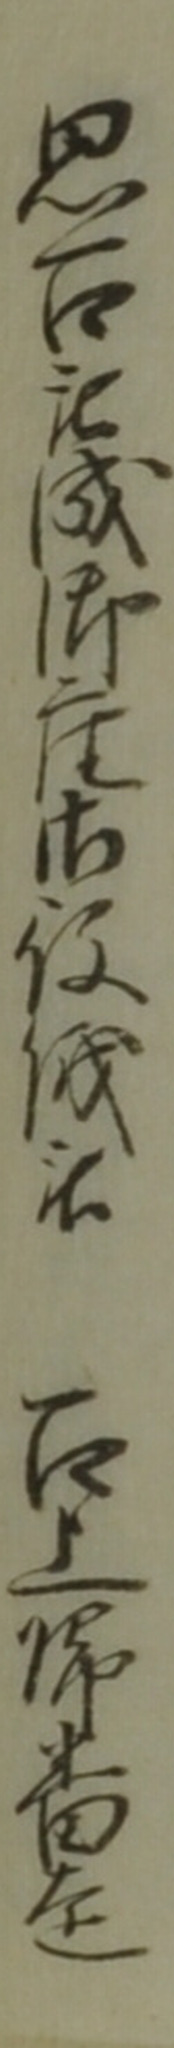思召被成御座御役儀被召上帰番遠
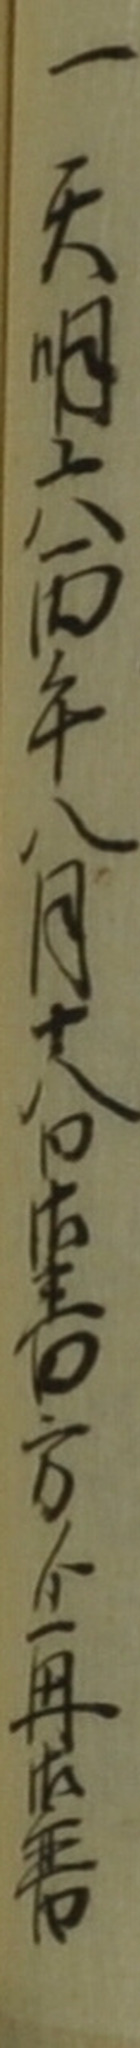一天明六丙午八月十八日御番方ゟ再御普
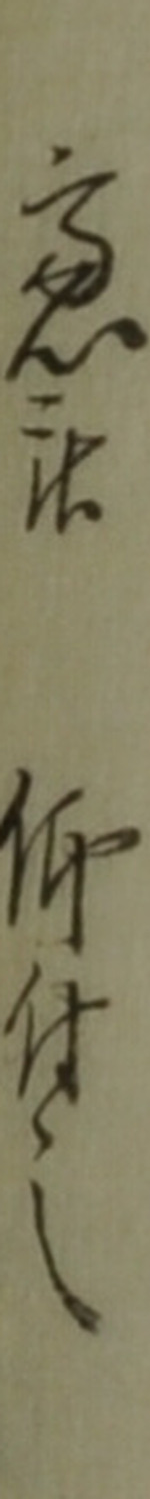慮被仰付之
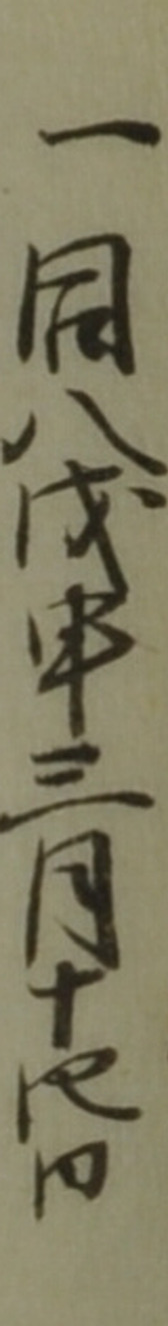一同八戊申三月十四日
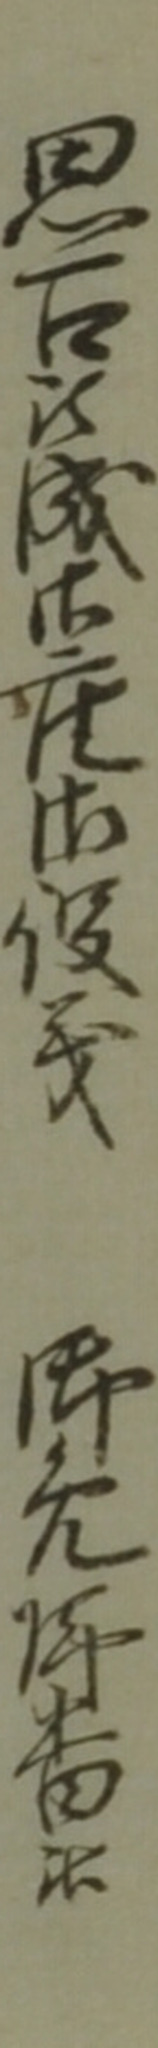思召被成御座御役儀御免帰番被
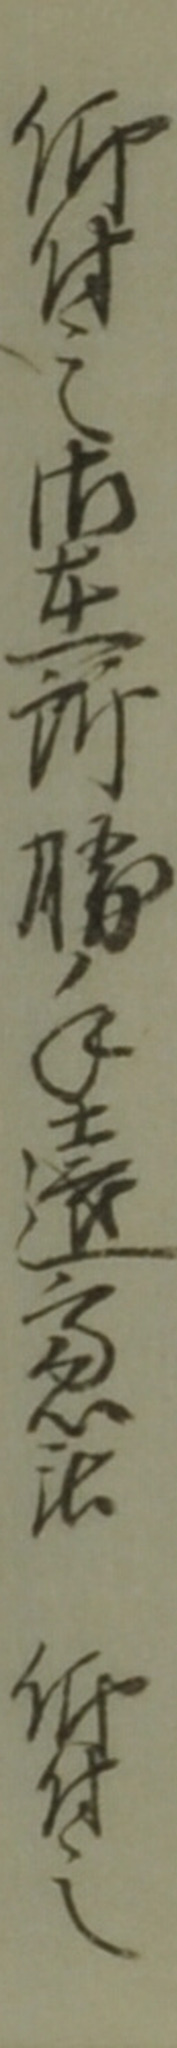仰付之御在所勝手遠慮被仰付之
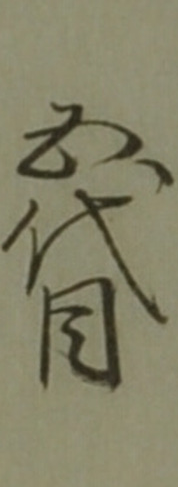五代目
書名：諸御役代々録（六）
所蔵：伊那市立高遠町図書館・合同会社AMANE
